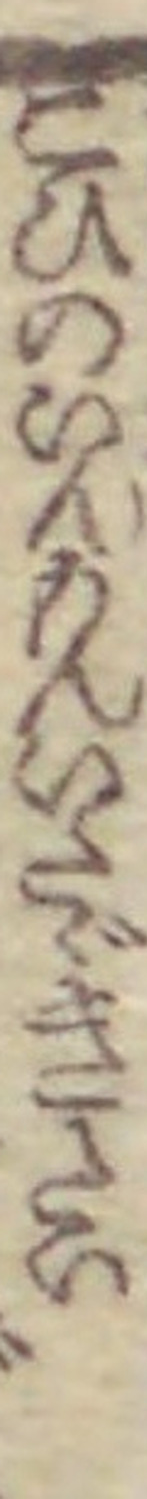こひのいんもんいたゞきたい
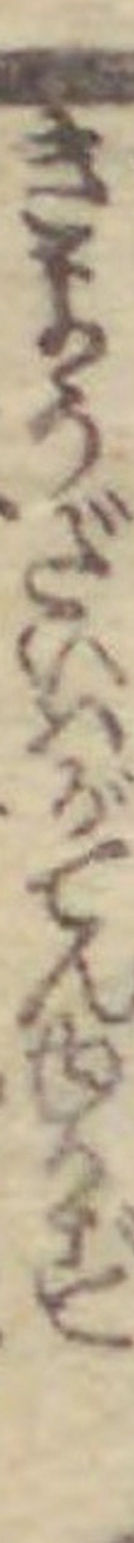きようだいはがてんゆかず
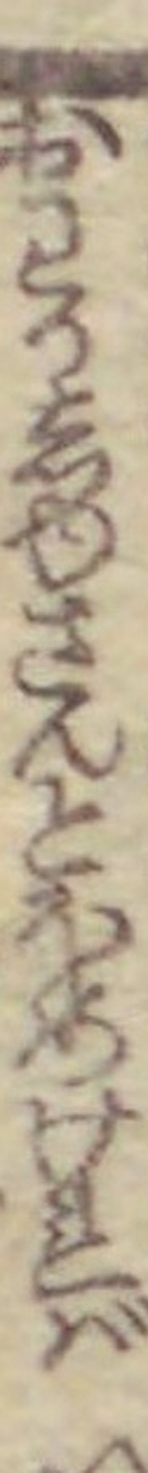おわりしゆさんとほめければ
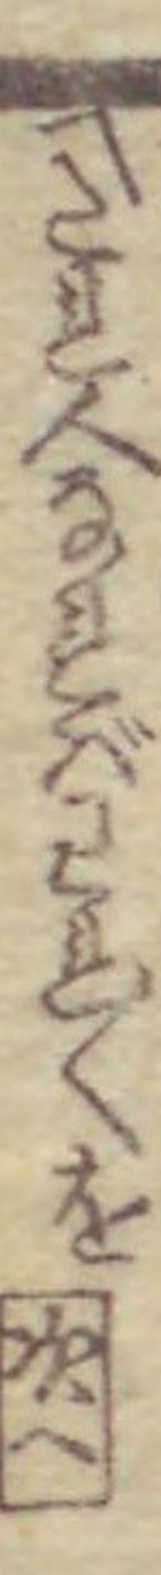〽たれ人なればわれ〳〵を次へ

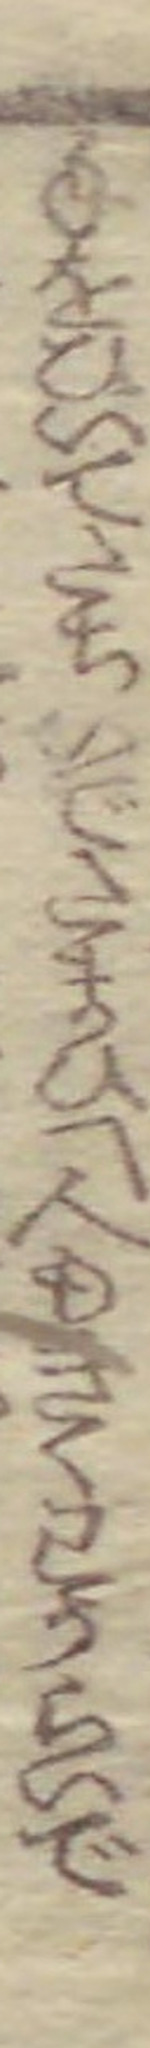手をひいてたちいでたまひ〽人もきくわうらいで
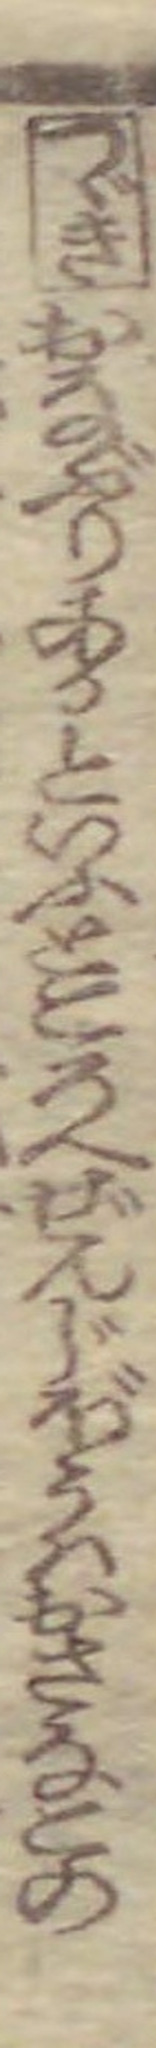つゞきおなぶりあるといふところへぜんじぼうはおさなこの
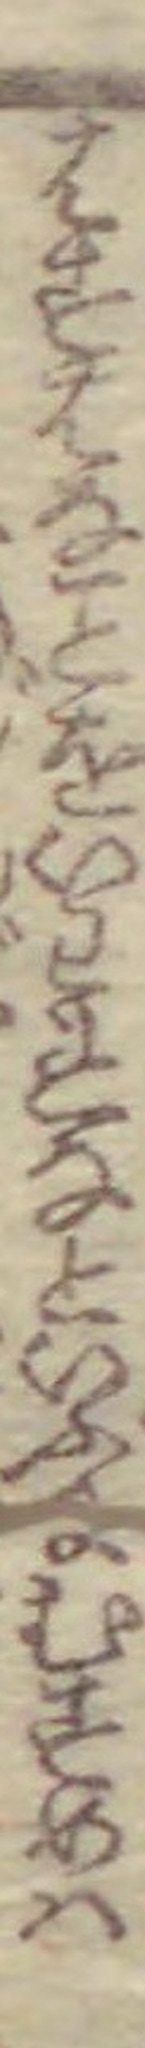はすはなことをいわれなといふにむすめは
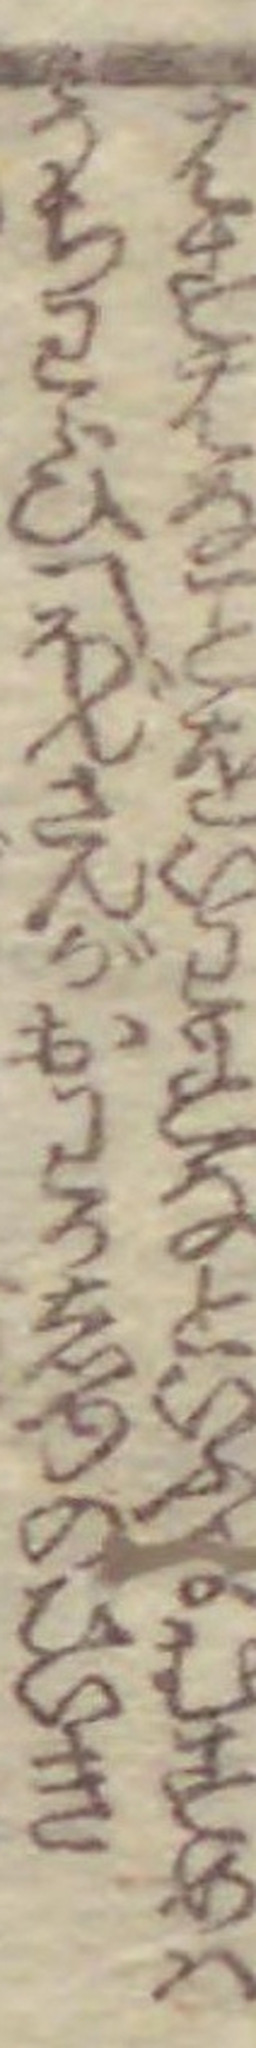うちわらひ〽ぼんさんがおわかしゆのひいき
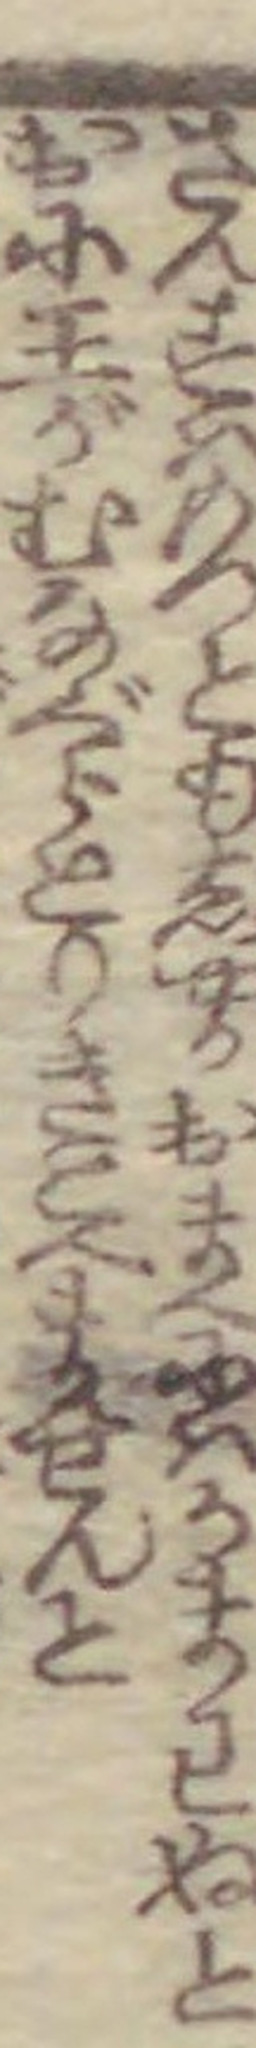おに王がむなぐらとりきこへませんと
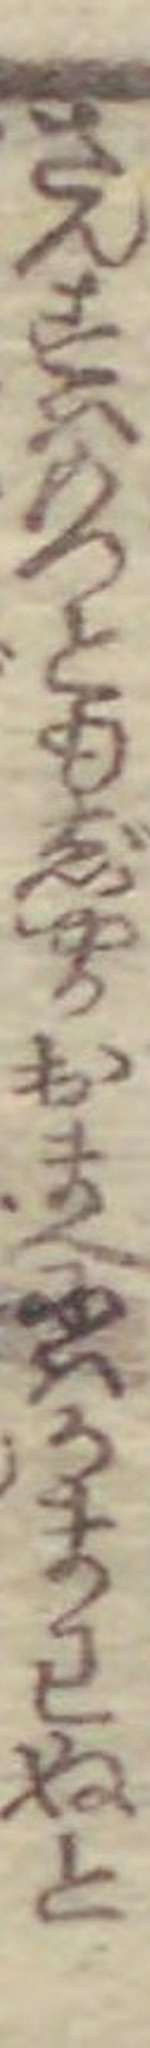さんすはもつともじやかおまへにはかまわぬと
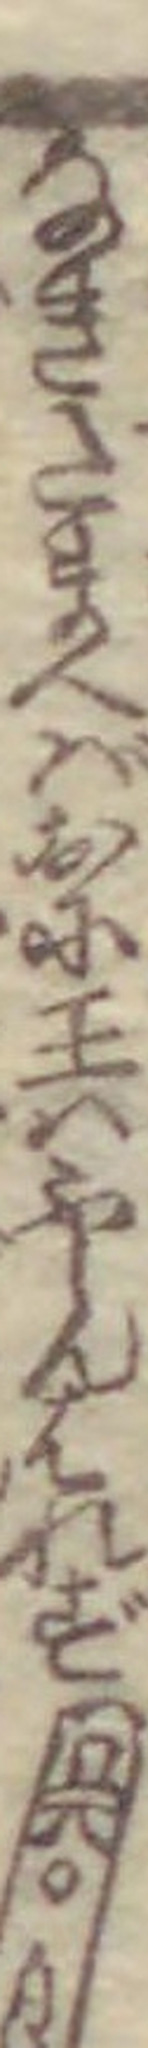なきたまへばおに王はふしんはれず
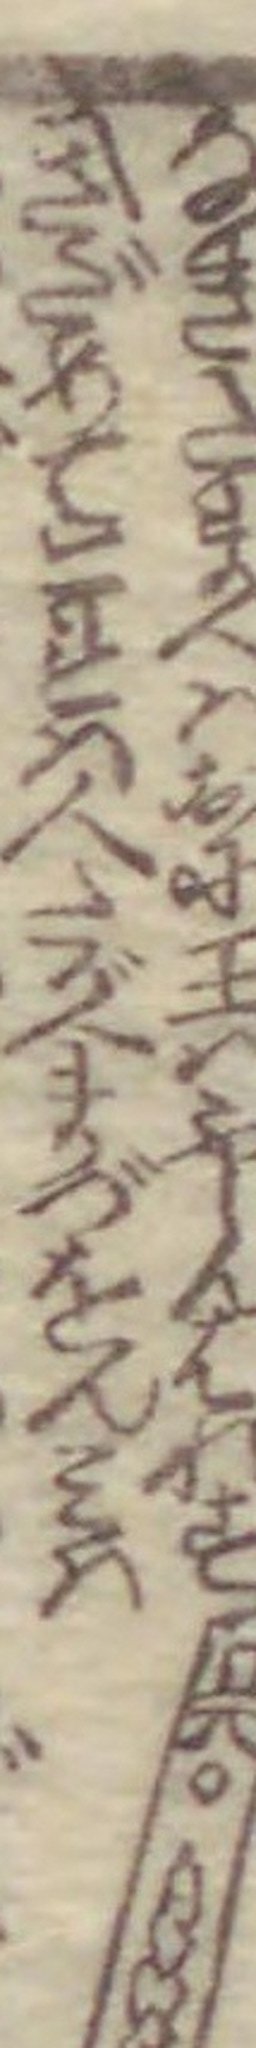〽さだめてこれは人たがへまづをんみは
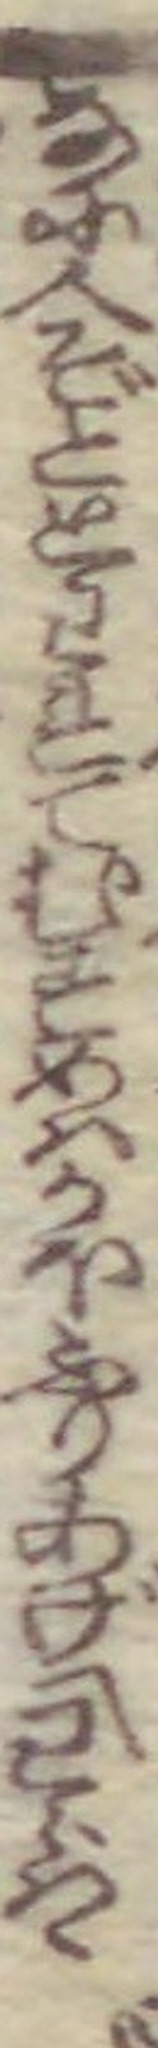なに人ぞととわれてむすめはかほふりあげ〽己らはゝ
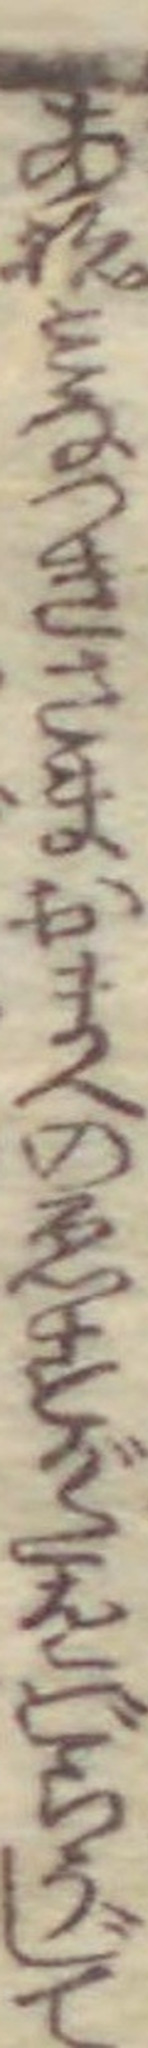あねみなつきさまおまへのゑすがたをごらうじて
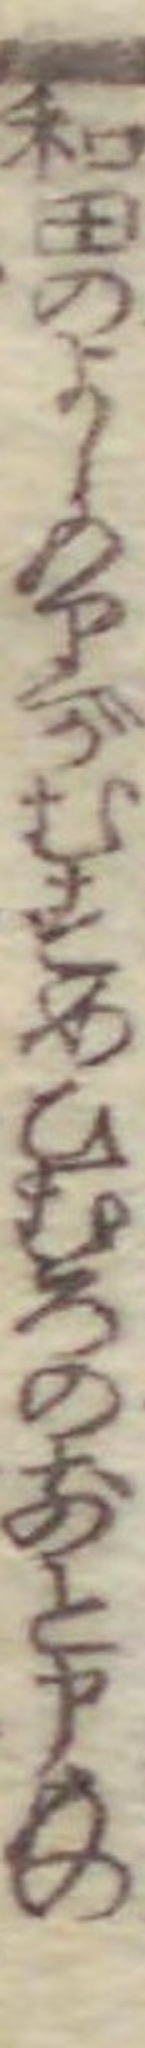和田のよしもりがむすめひむろの前と申もの
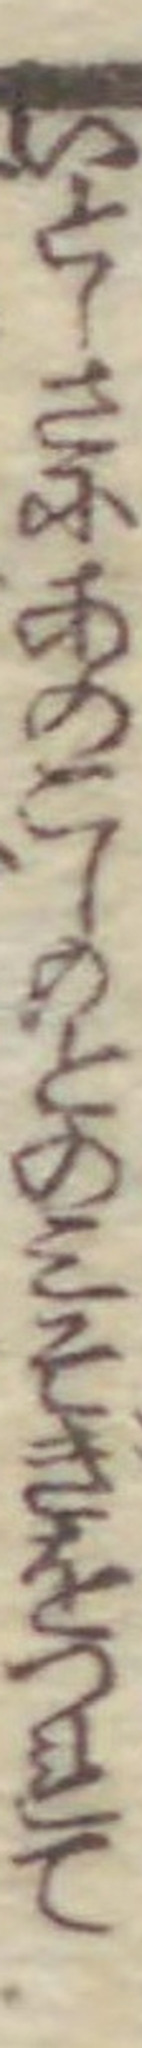いとしさにあのこしもとのみぞぎをつれて
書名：大時代唐土化物 3巻. 曽我太夫染
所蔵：国立国会図書館 National Diet Library, JAPAN
